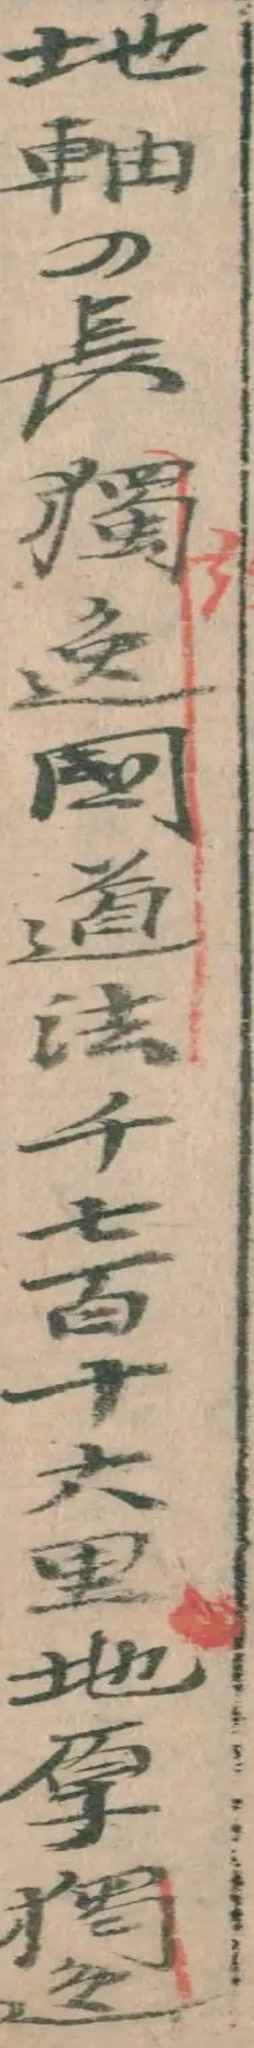地軸の長独逸国道法千七百十六里地厚独逸
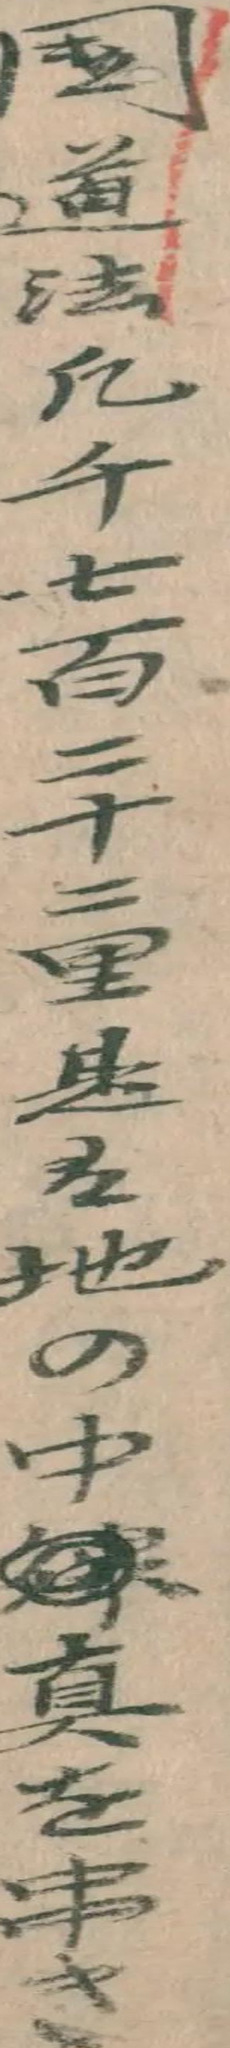国道法凡千七百二十二里是は地の中真を串き

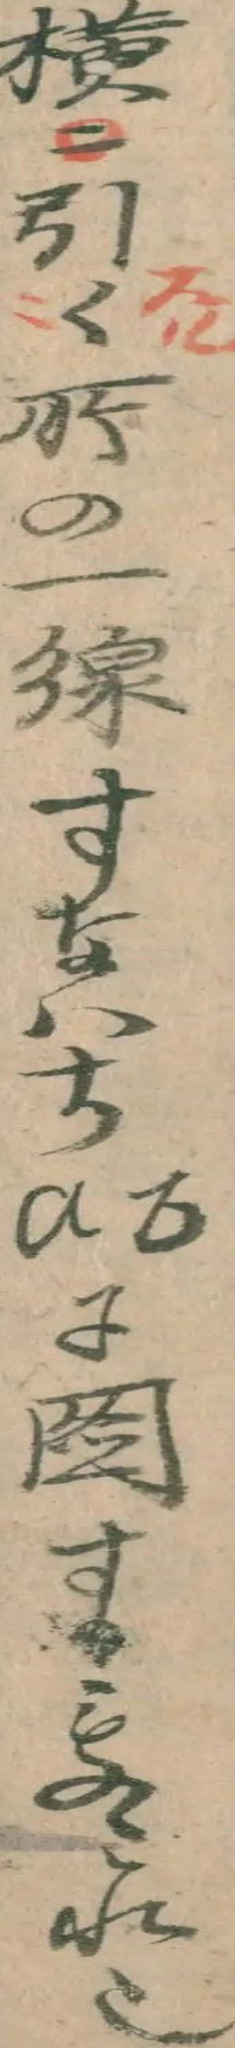横引スル所の一線すなはちに図するものこれ也
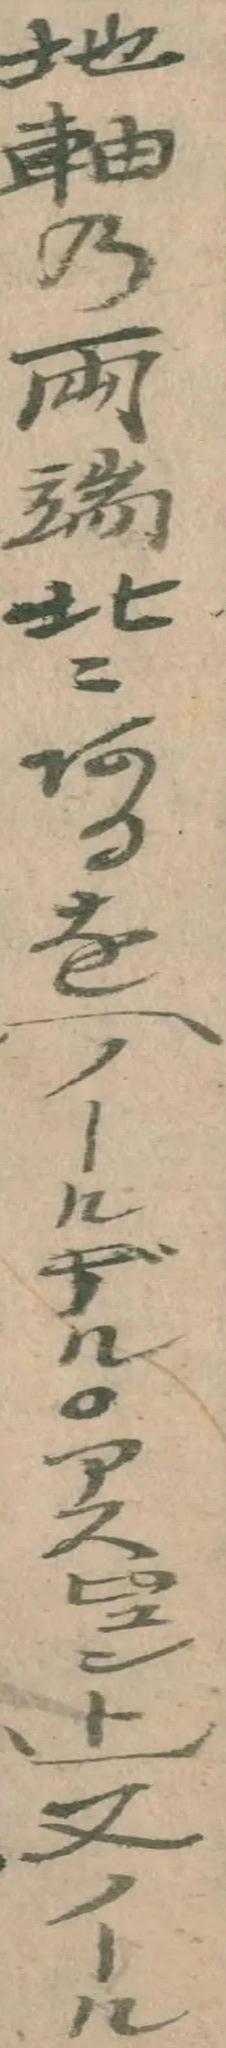地軸の両端北にあるを(ノールデル・アスピュント)又ノール
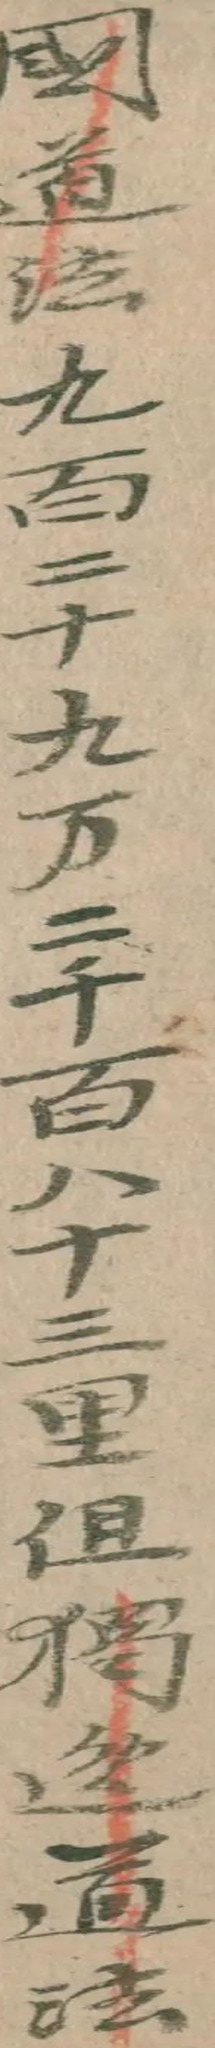国道法九百二十九万二千百八十三里但独逸道法
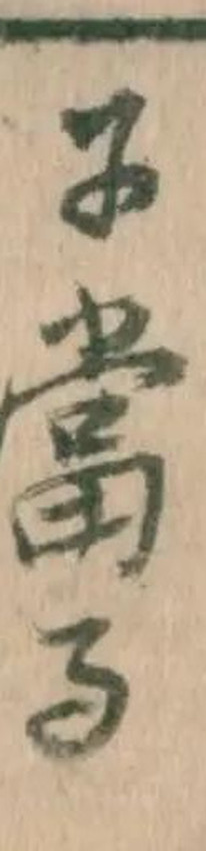に当る
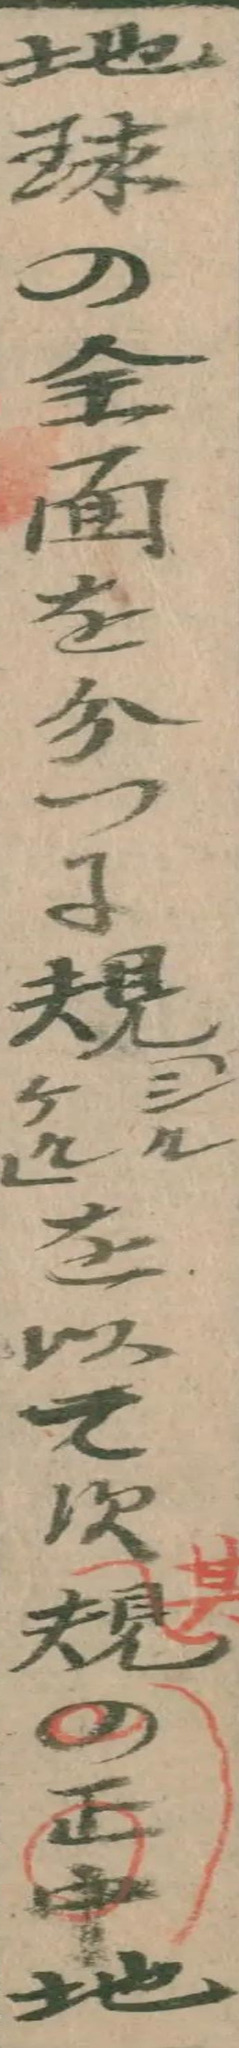地球の全面を分つに規「シルケル」を以てす其規の正中地
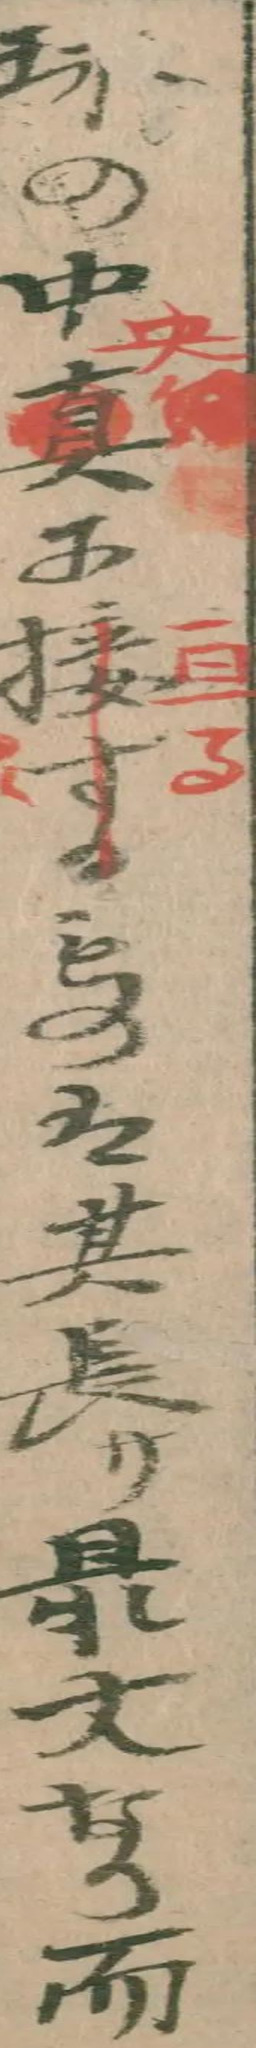球の中央に亘るものは其長サ最大なり而
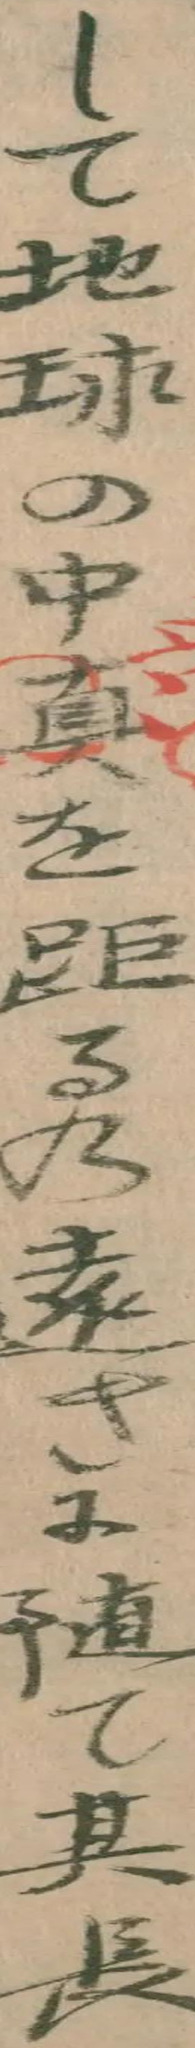して地球の中央線を距るの遠きに随て其長
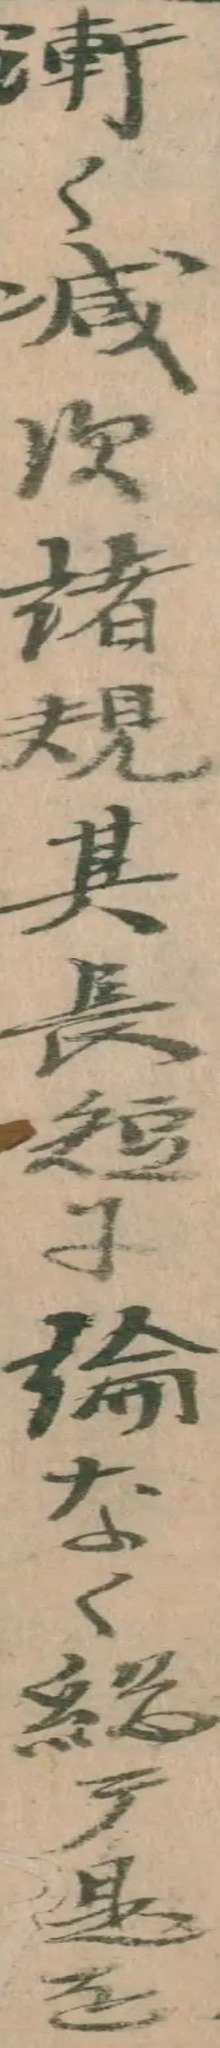漸く減す諸規其長短に論なく総テ是を
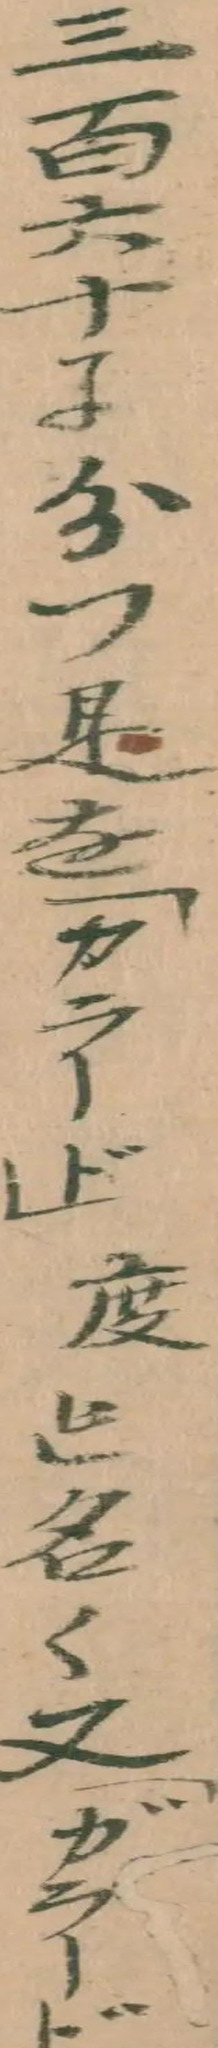三百六十に分つ是を「カラード」度と名く又「ガラード」
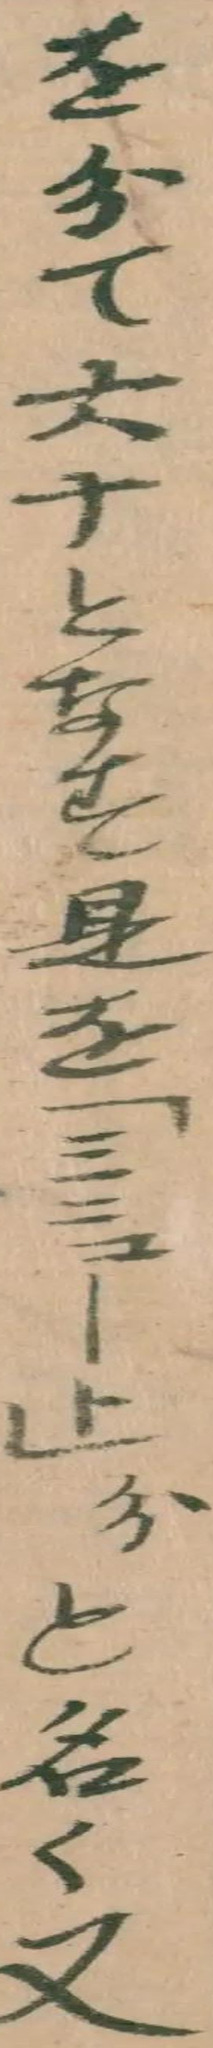を分て六十となす是を「ミニュート」分と名く又
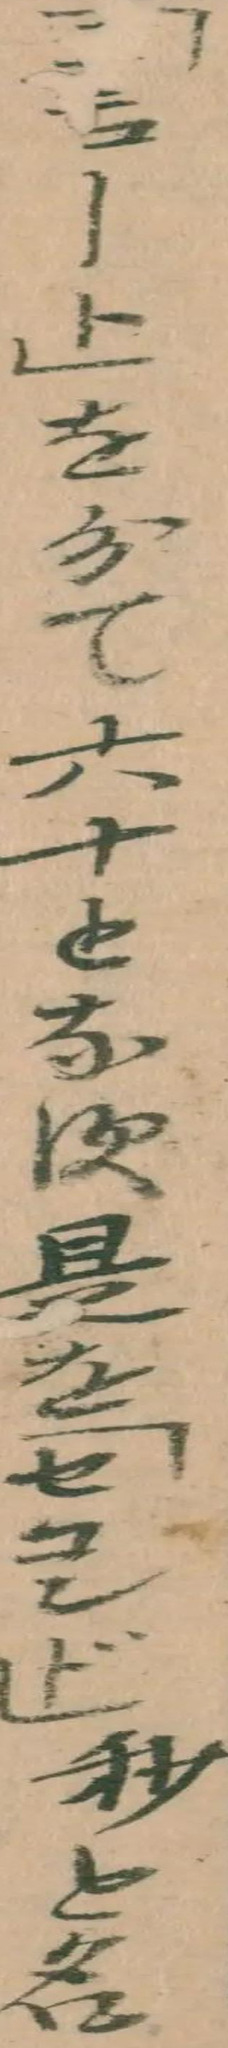「ミニュート」を分て六十となす是を「セコンド」秒と名
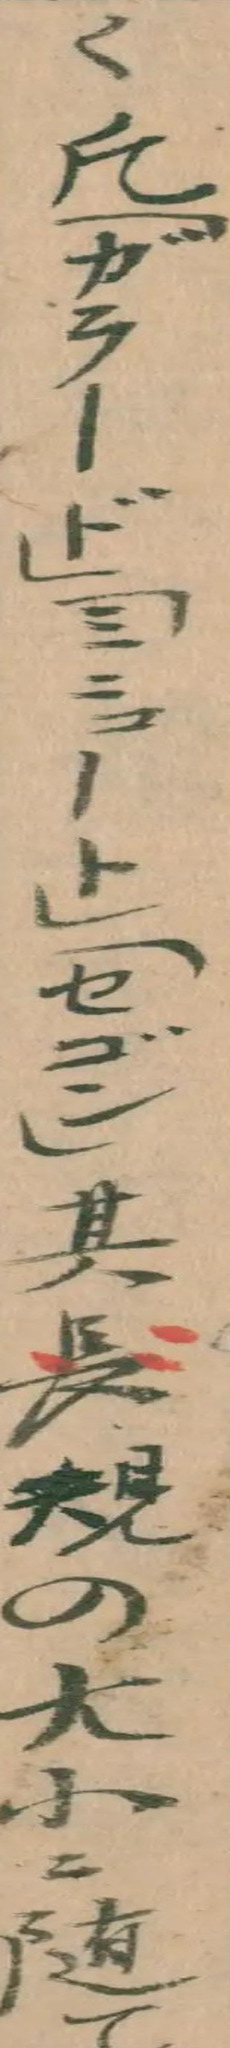く凡「ガラード」「ミニュート」「セゴン」其規の大小に随て
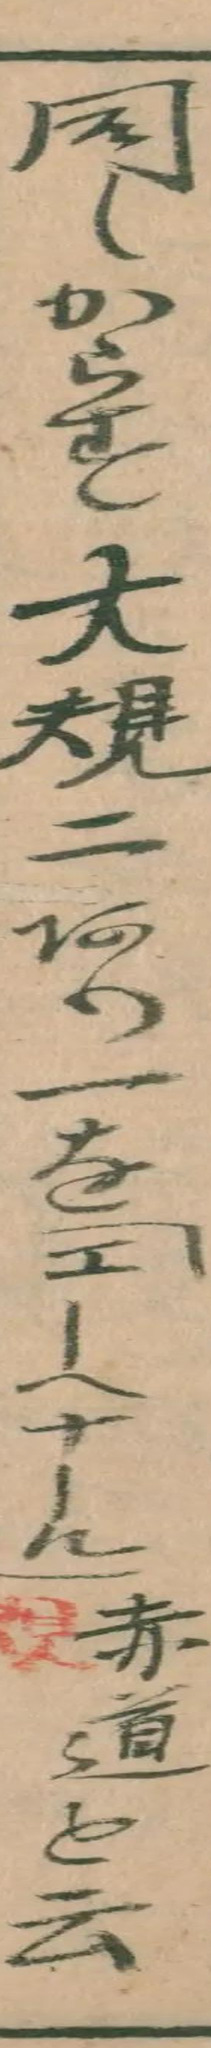同しからす大規にあり一を「エーヘナール」赤道規と云
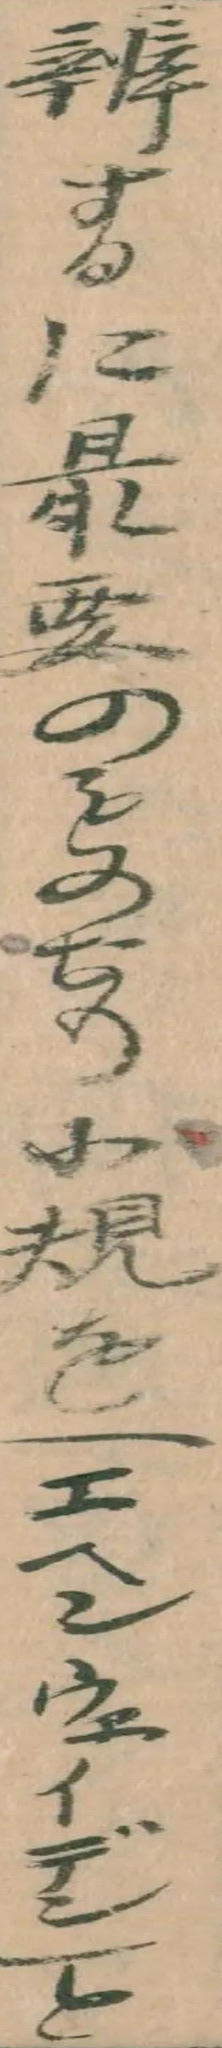弁するに最要のものなり小規を「エヘンウェイデン」と
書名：新釈輿地図説
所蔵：国立国会図書館 National Diet Library, JAPAN
